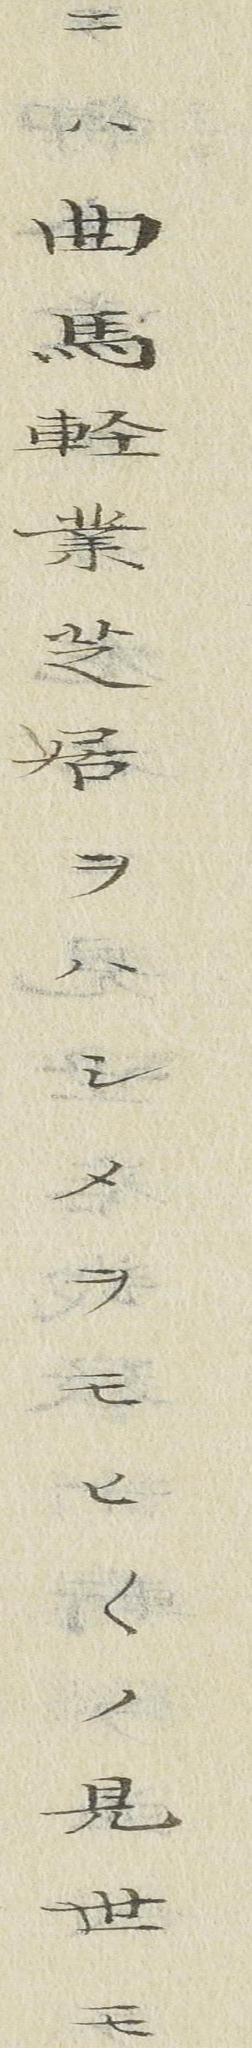ニハ曲馬軽業芝居ヲハシメヲモヒ〱ノ見世モ
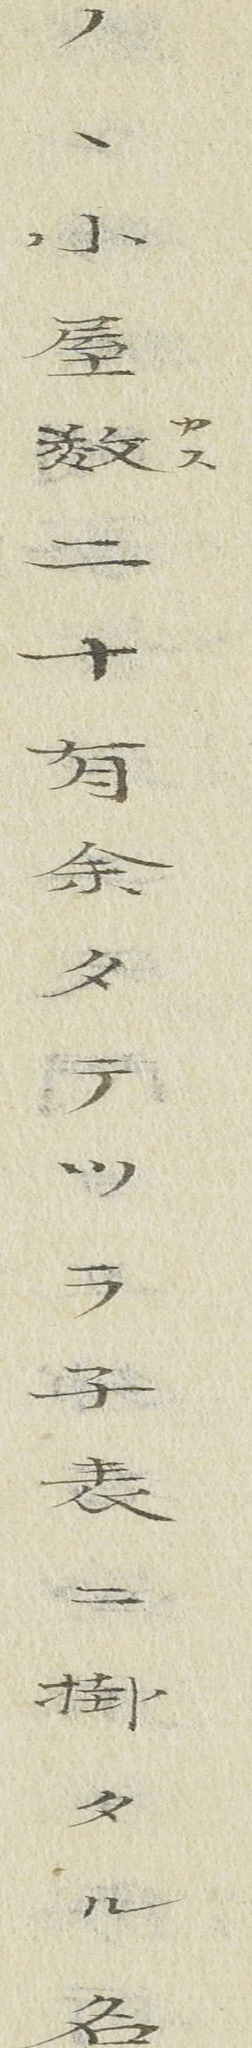ノヽ小屋数二十有余タテツラ子表ニ掛タル名
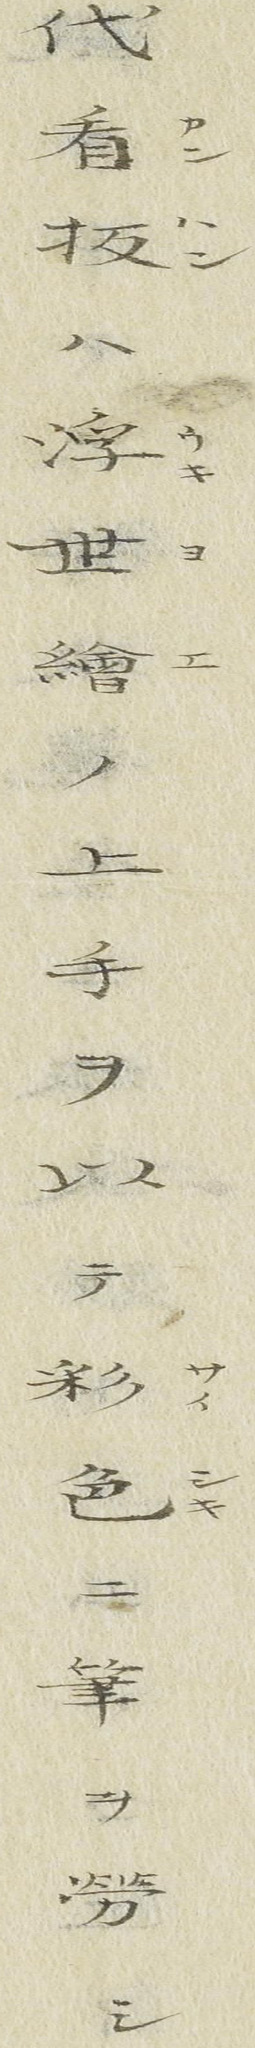代看板ハ浮世絵ノ上手ヲ以テ彩色ニ筆ヲ労シ
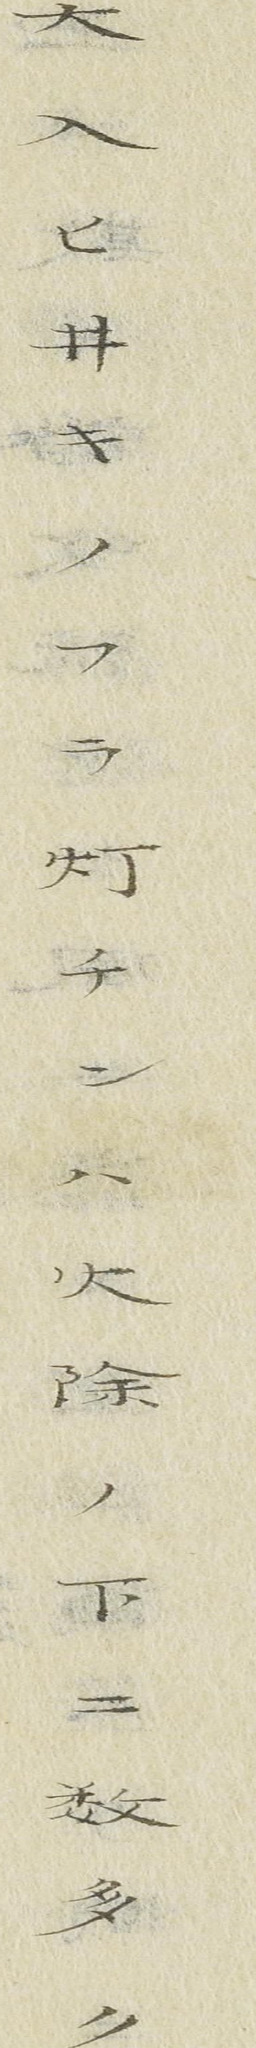大入ヒヰキノフラ灯チンハ火除ノ下ニ数多ク
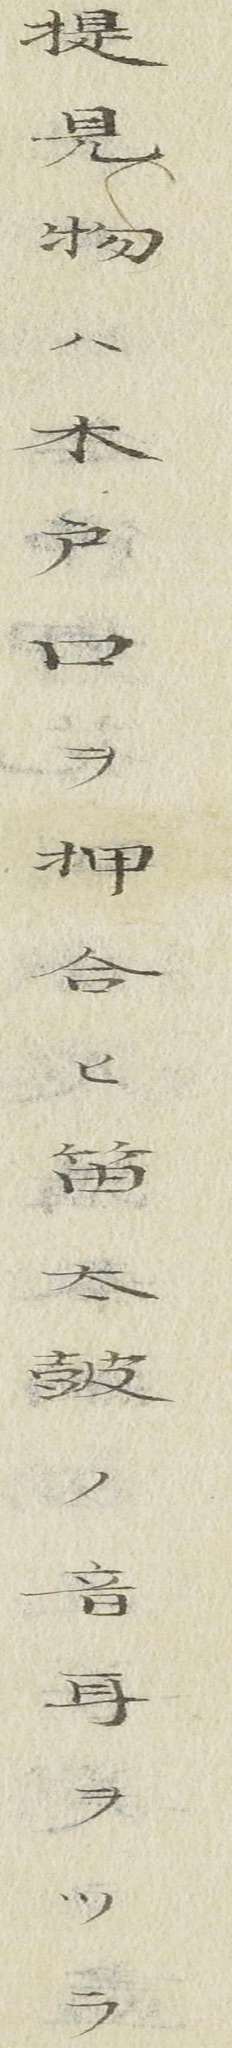提見物ハ木戸口ヲ押合ヒ笛太鼓ノ音耳ヲツラ
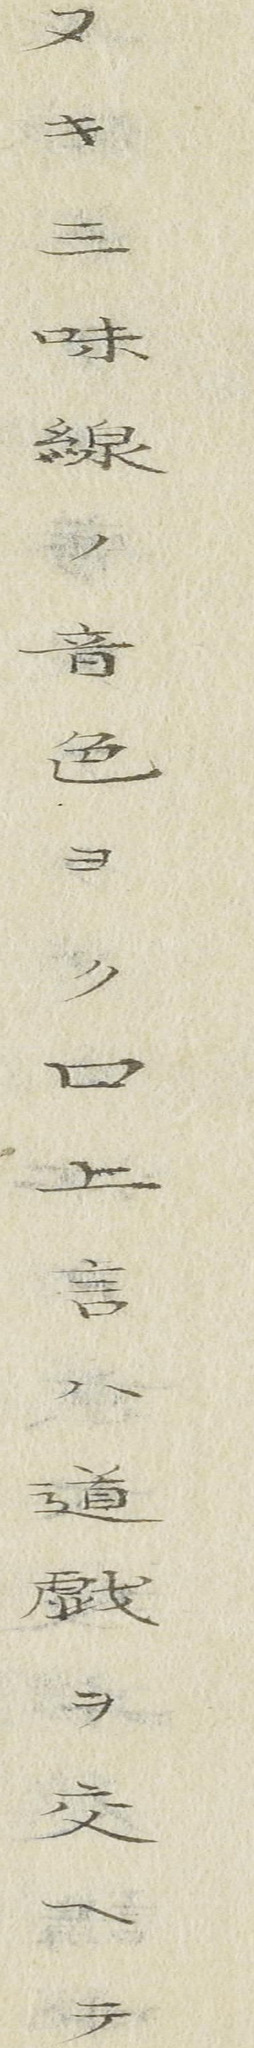ヌキ三味線ノ音色ヨク口上言ハ道戯ヲ交ヘテ
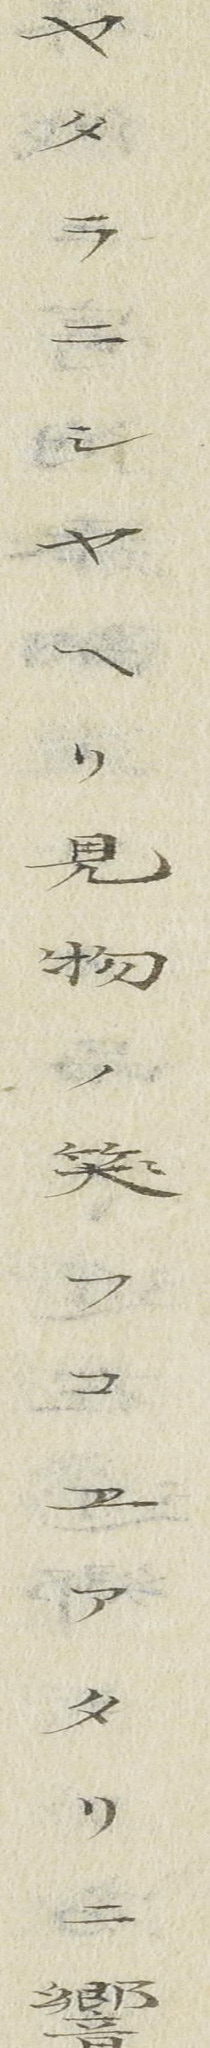ヤタラニシヤヘリ見物ノ笑フコエアタリニ響
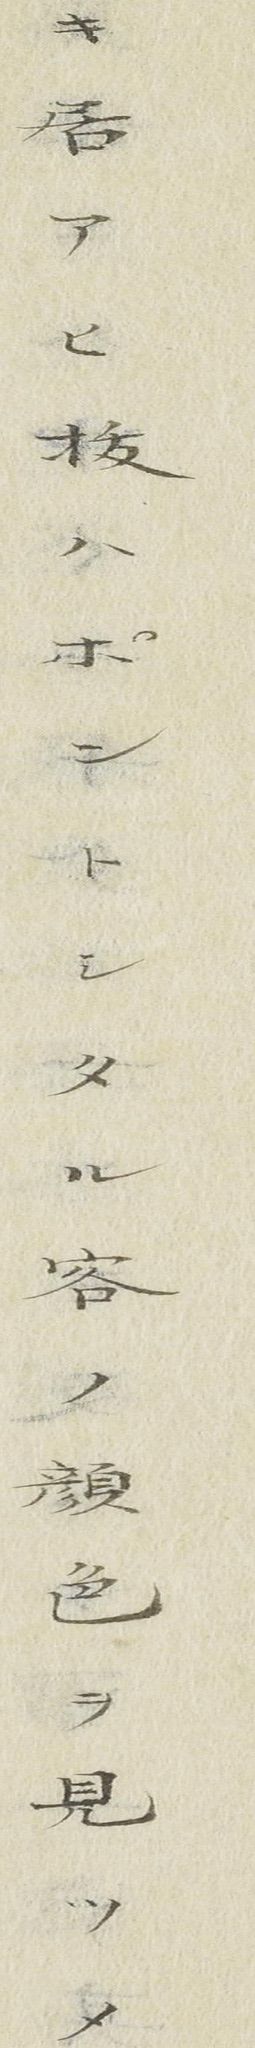キ居アヒ抜ハポントシタル客ノ顔色ヲ見ツメ
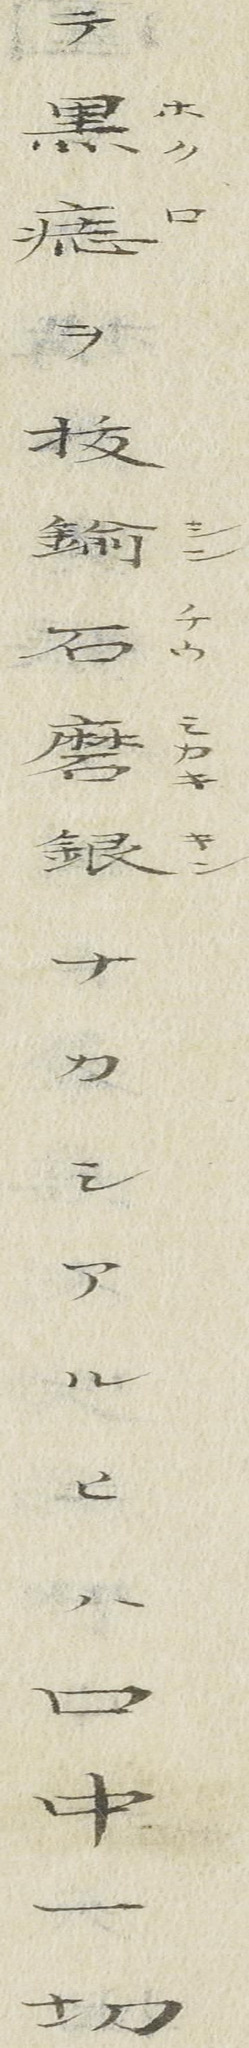テ黒痣ヲ抜鍮石磨銀ナカシアルヒハ口中一切
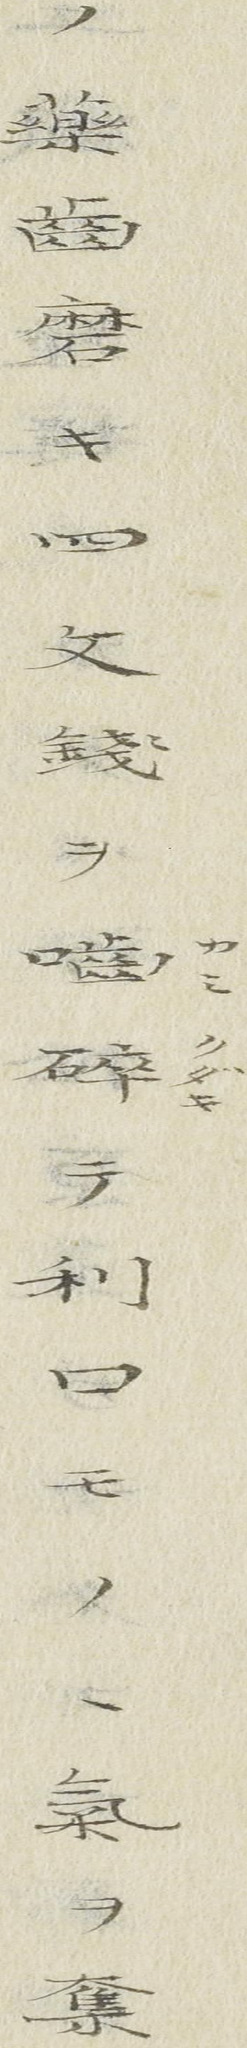ノ薬歯磨キ四文銭ヲ噛砕テ利口モノヽ気ヲ奪
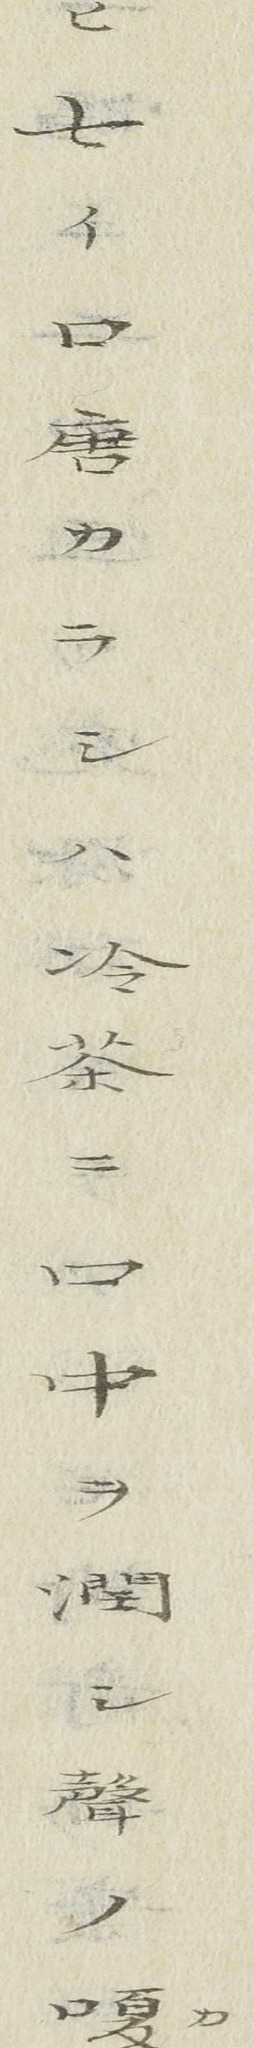ヒ七イロ唐カラシハ冷茶ニ口中ヲ潤シ声ノ嗄
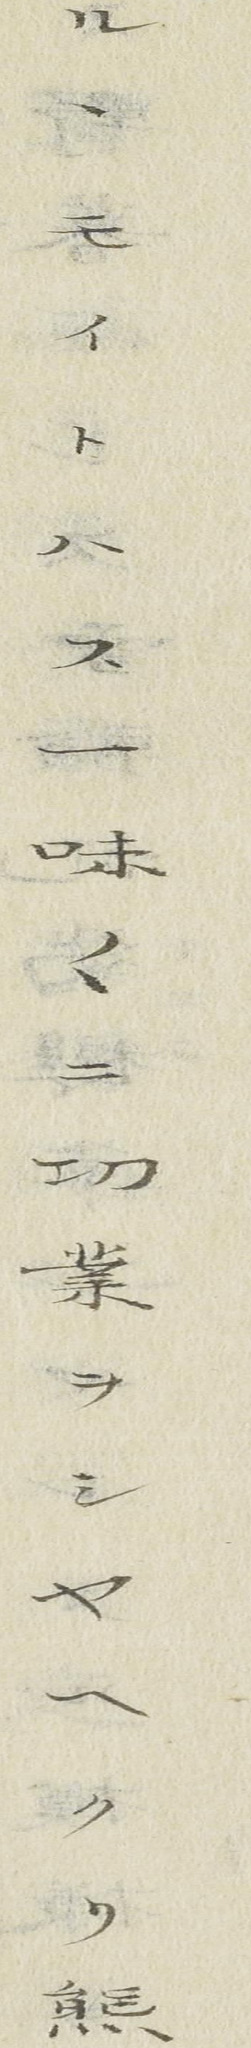ルヽモイトハス一味〱ニ功業ヲシヤヘクリ熊
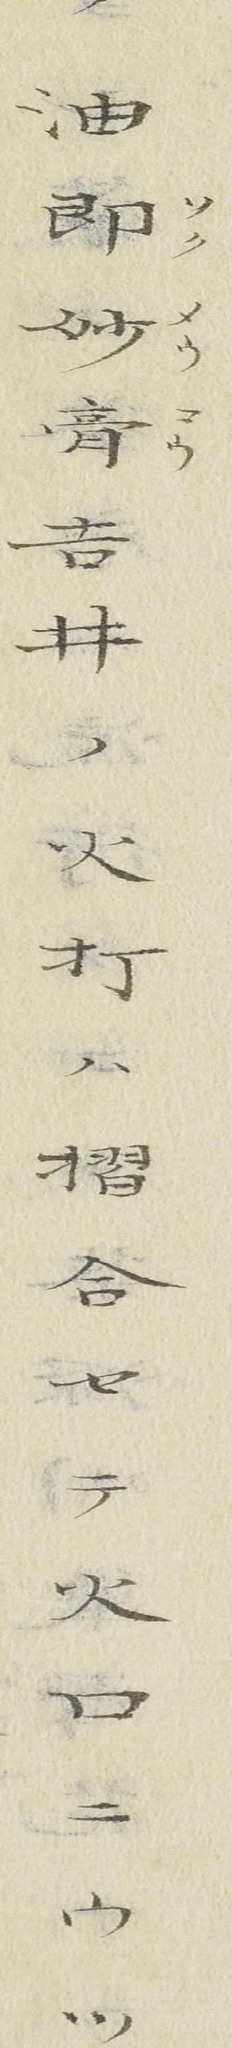ノ油即妙膏吉井ノ火灯ハ摺合セテ火口ニウツ
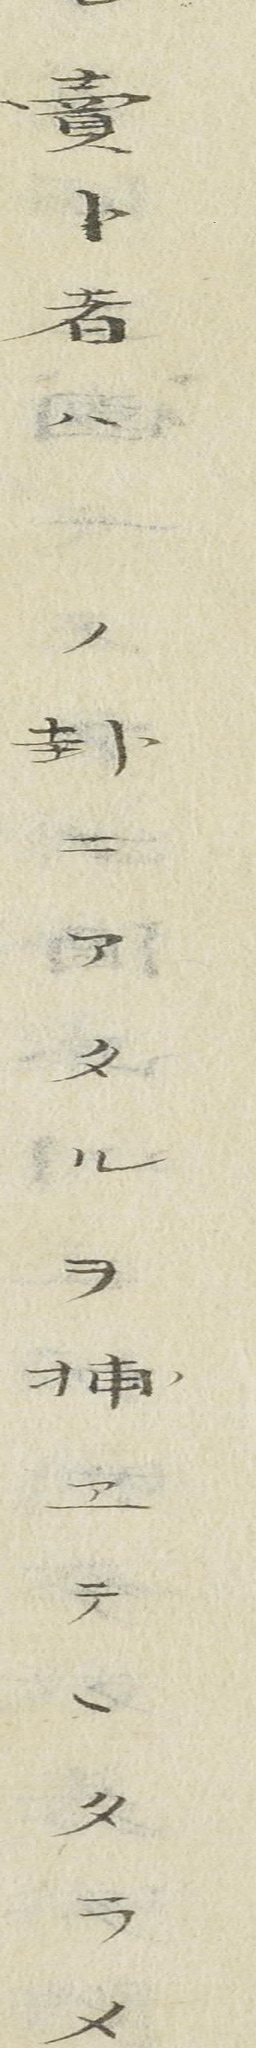シ売ト者ハノ卦ニアタルヲ捕エテヽタラメ

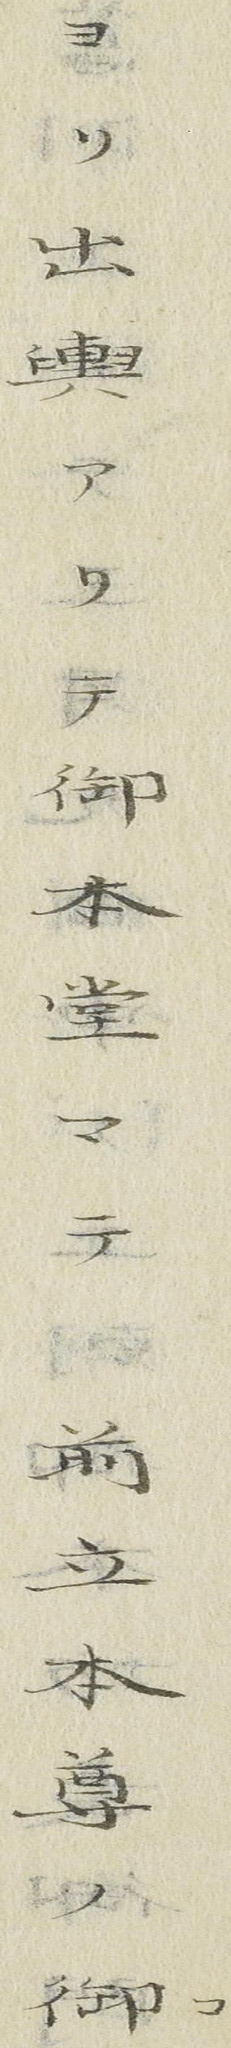ヨリ出輿アリテ御本堂マテ前立本尊ノ御
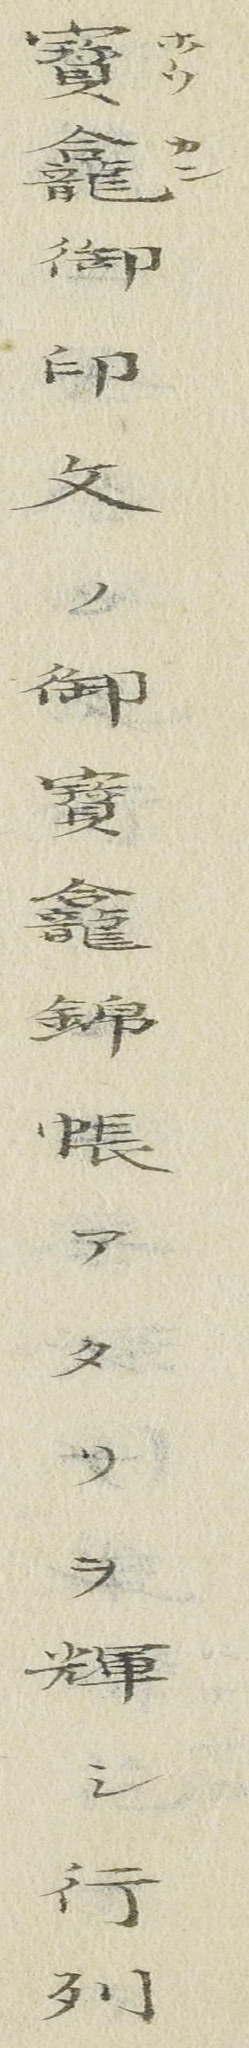宝龕御印文ノ御宝龕錦帳アタリヲ輝シ行列
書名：地災撮要　地震之部　巻ノ二
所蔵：東京大学地震研究所図書室 Earthquake Research Institute Library, The University of Tokyo, JAPAN
